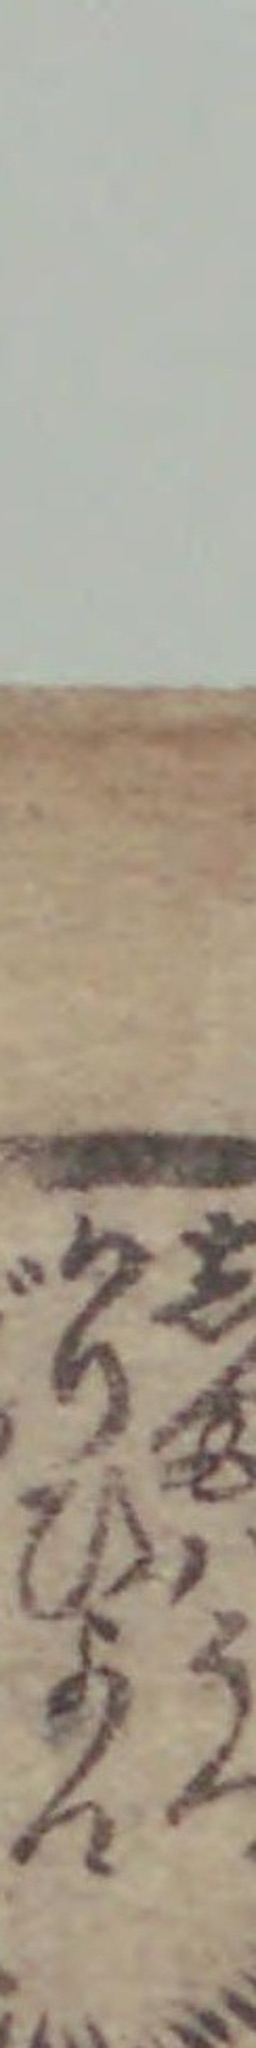かりひよん
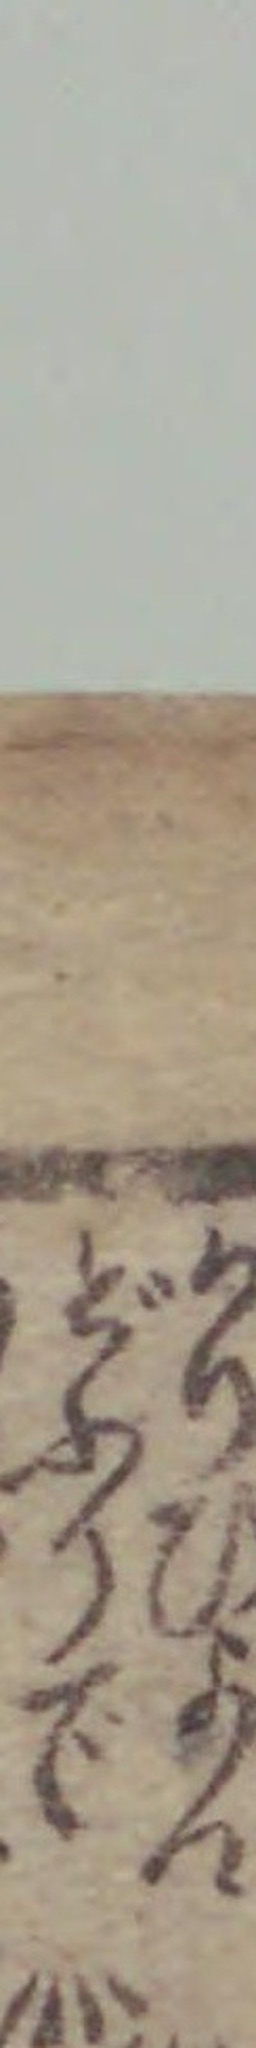どふりで
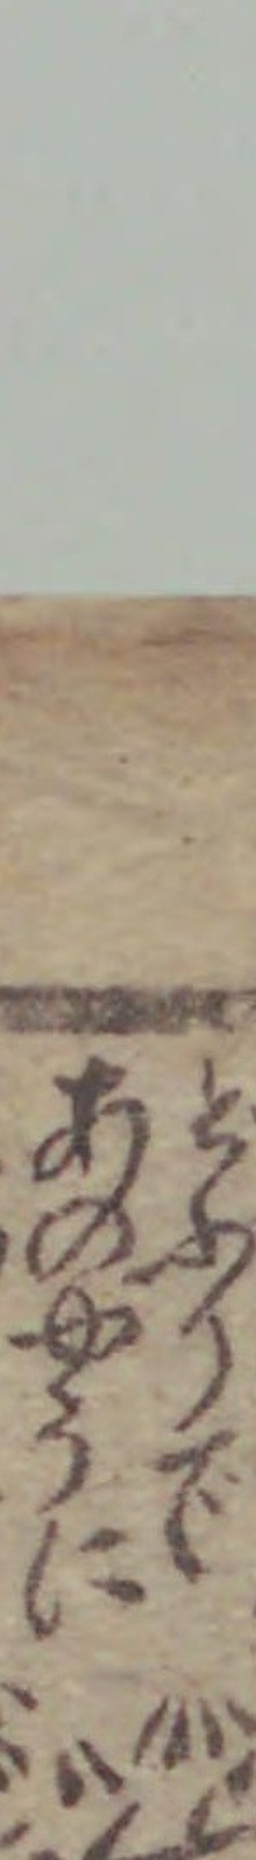あのやうに
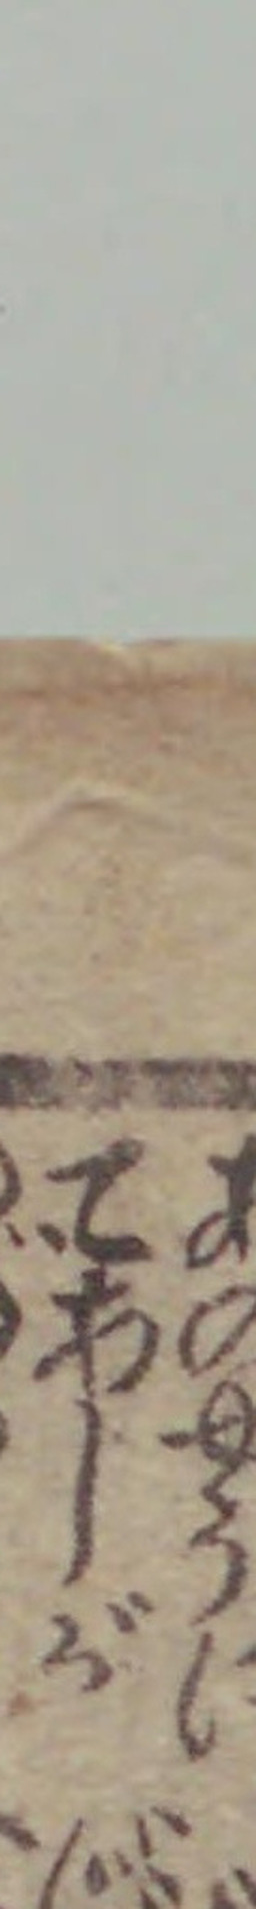てあしが
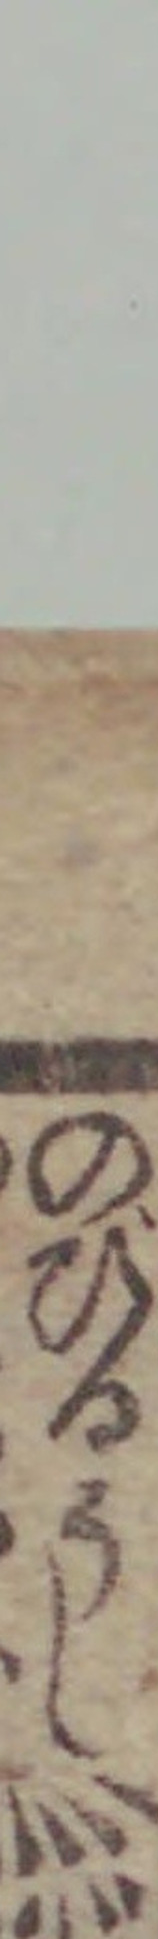のびるうし
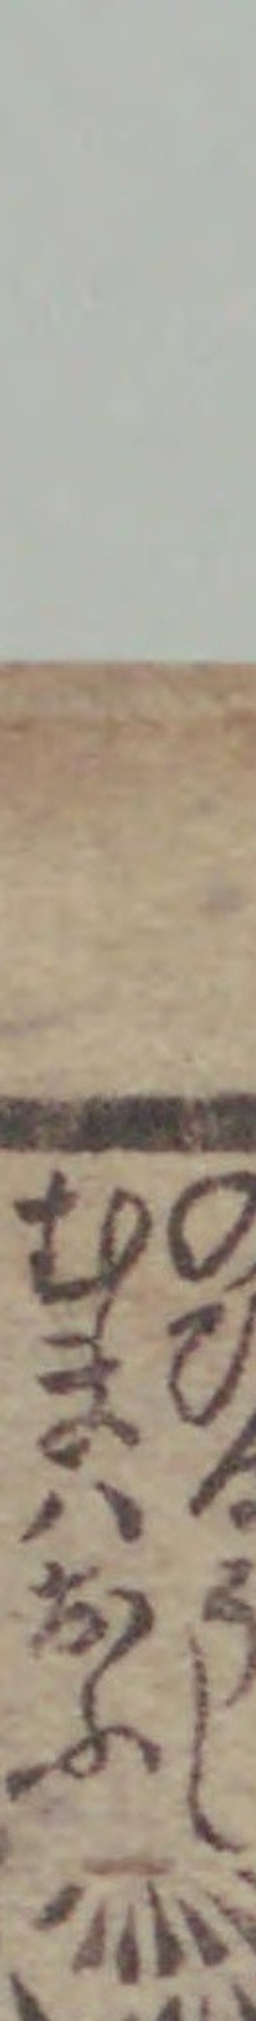むまはおふ
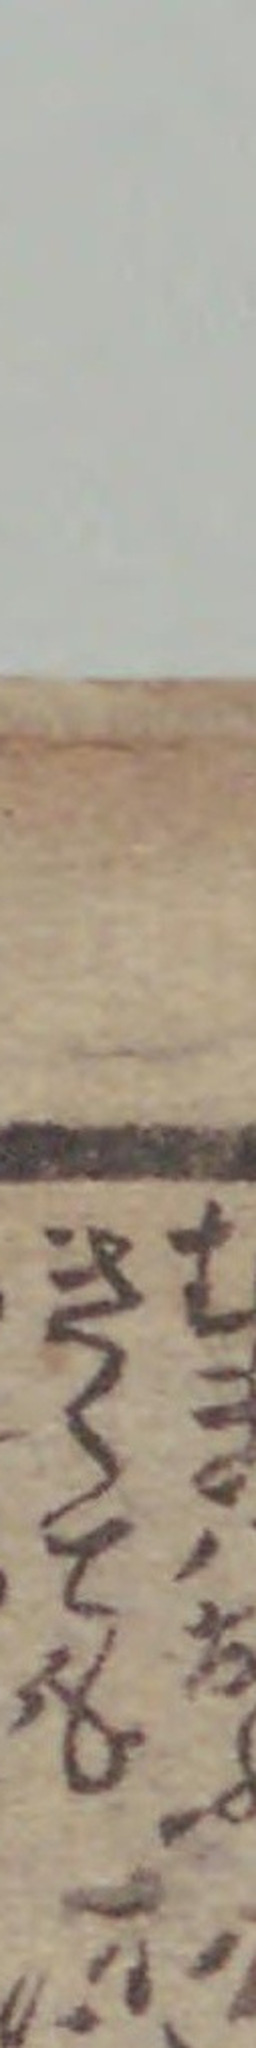きくても
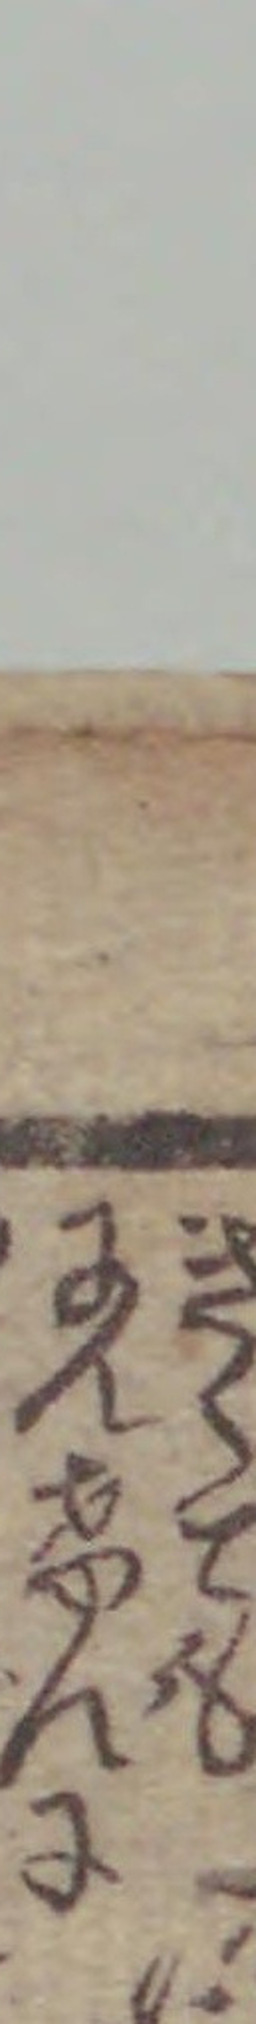にんけんに
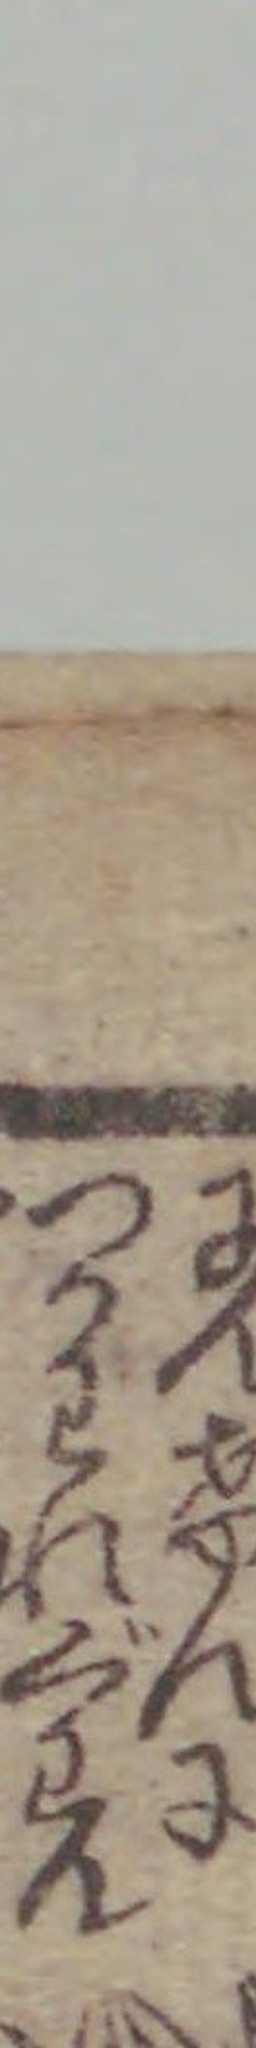つかわれぐわん
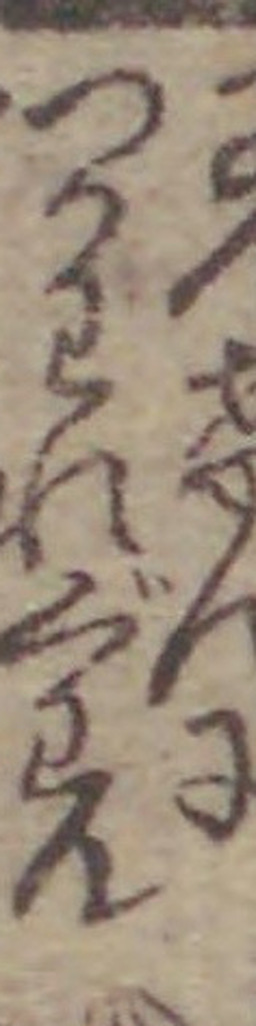つかわれぐわん
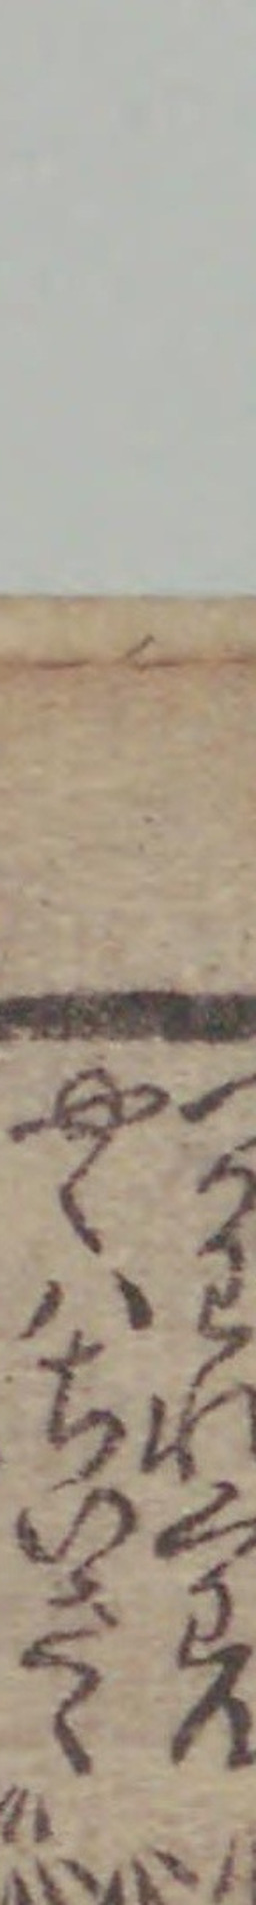やくはちいさく
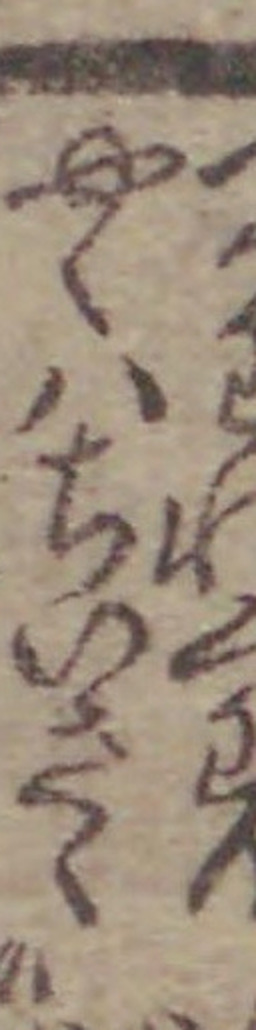やくはちいさく
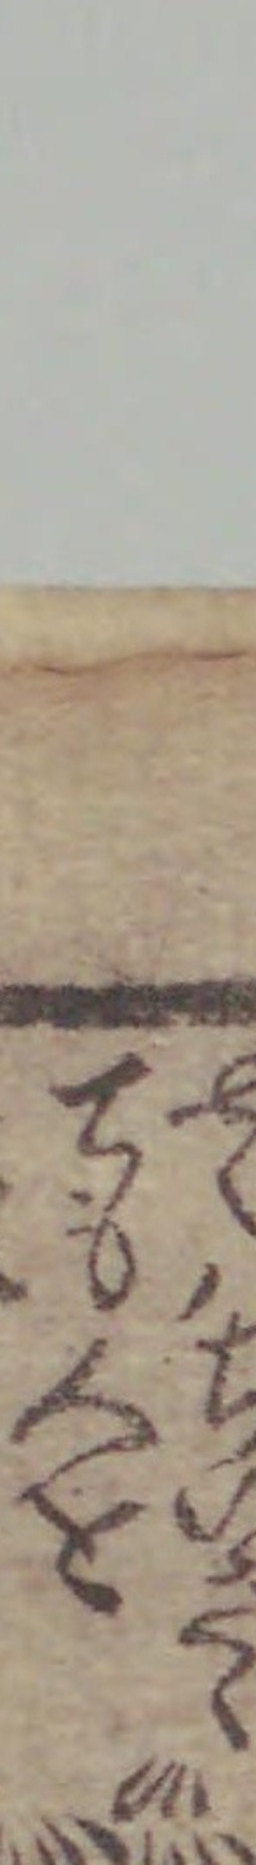ても人を
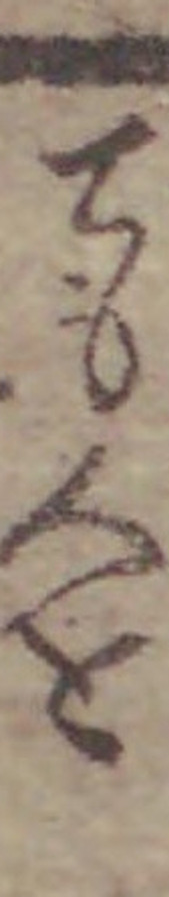ても人を
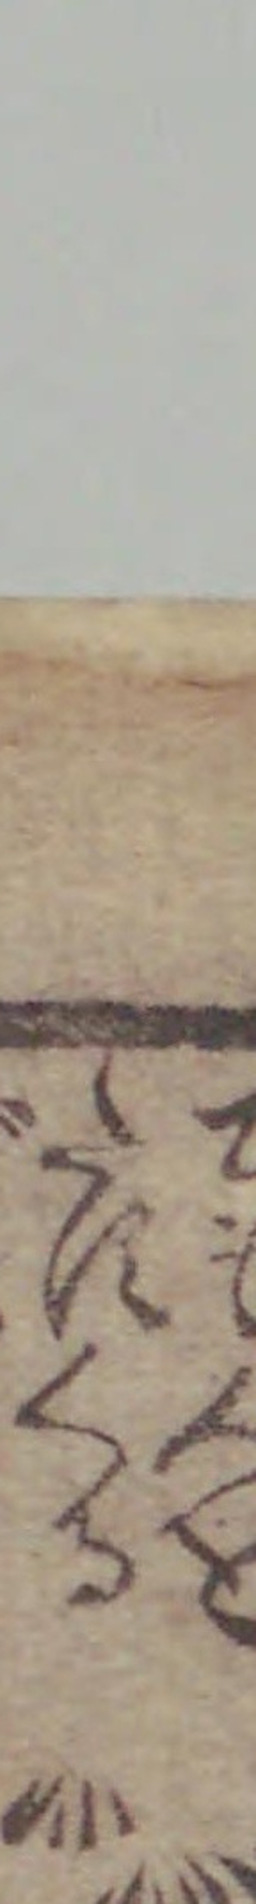たすくる
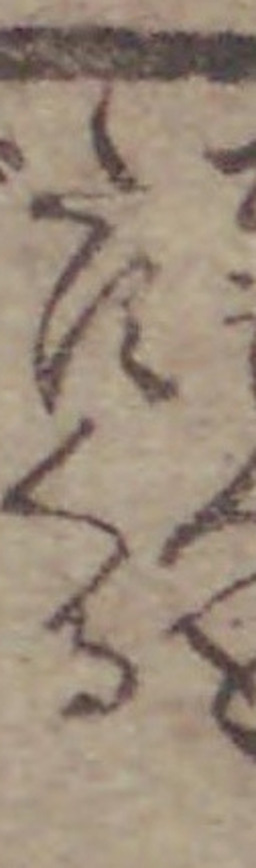たすくる
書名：近頃嶋めぐり 3巻
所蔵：国立国会図書館 National Diet Library, JAPAN
